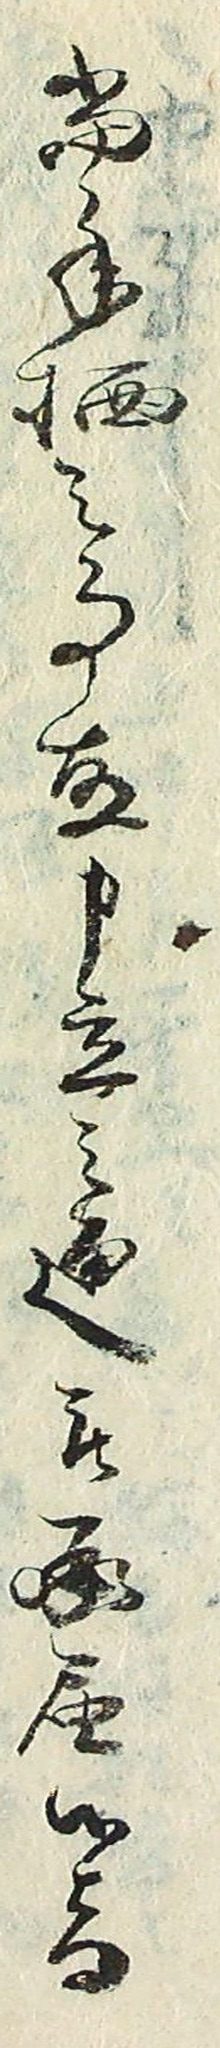當年柄之事故申立之通被承届候旨
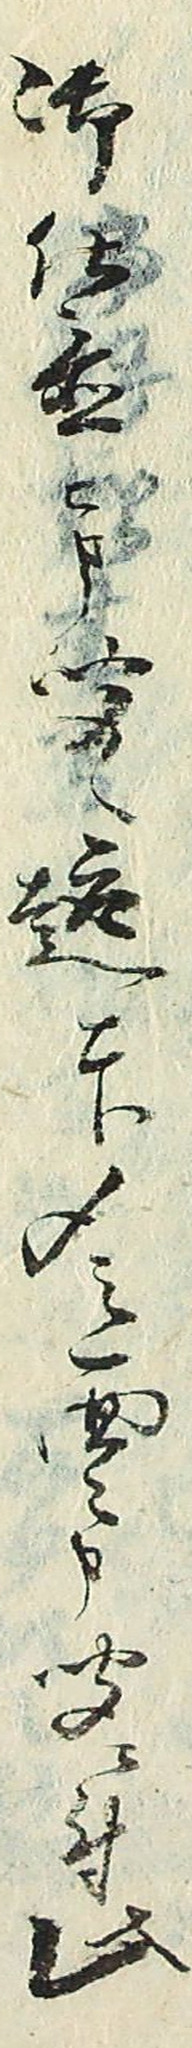御仕置被申聞候趣本〆之面々申聞ニ付此
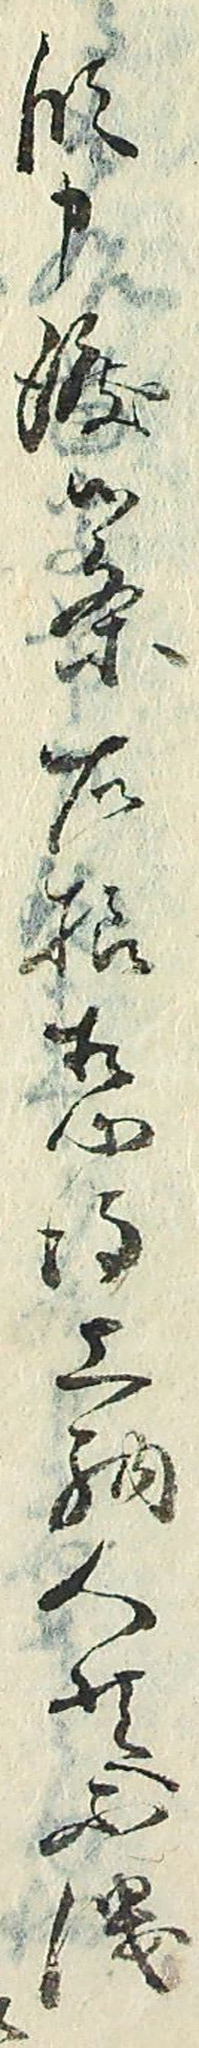段申渡候条左様相心得上納人共へ不洩様
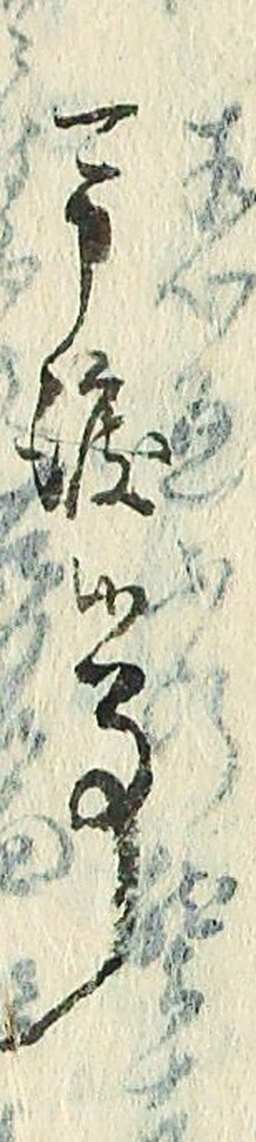可申渡候事
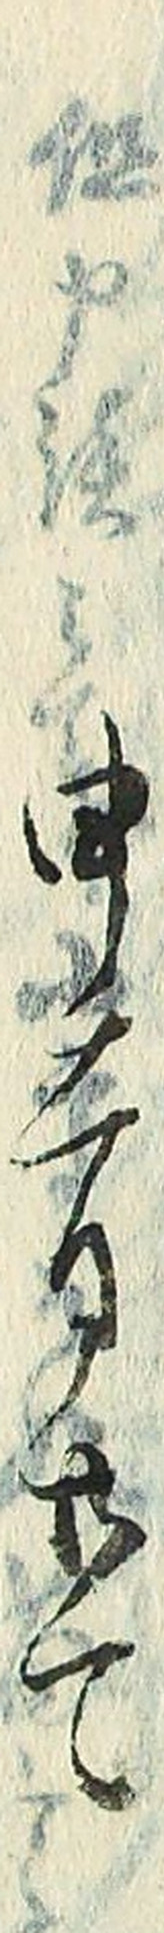申十一月廿一日
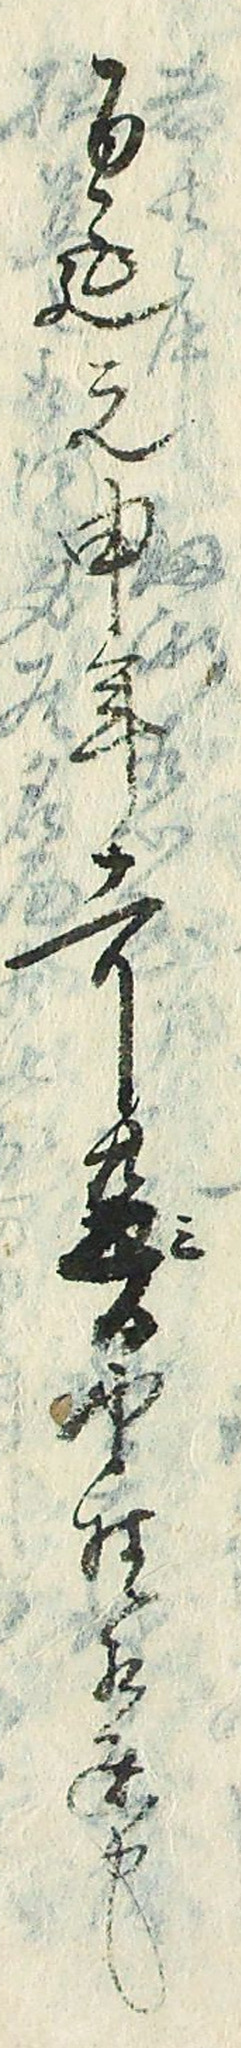万延元申年十一月廿三日中村へ相達申候

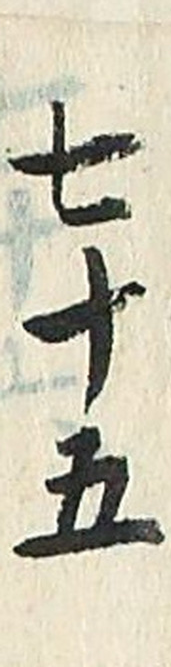七十五
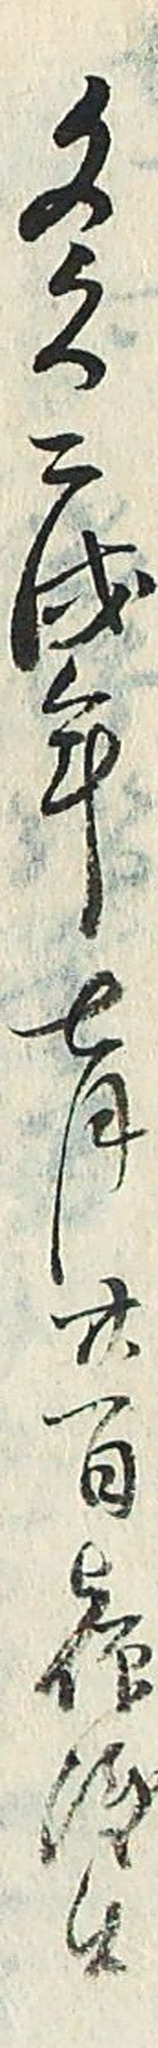文久二戌年七月廿一日被仰渡候
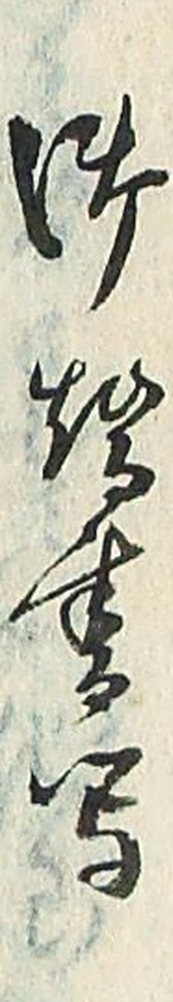御端書写
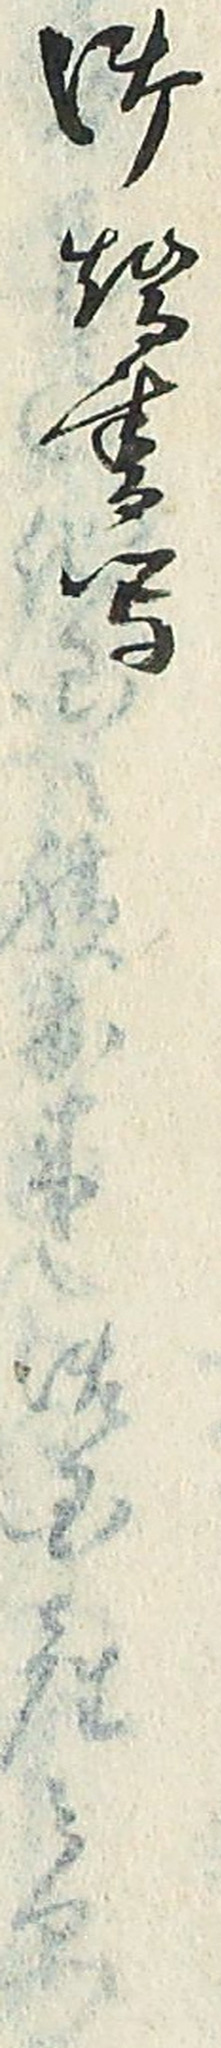御端書写
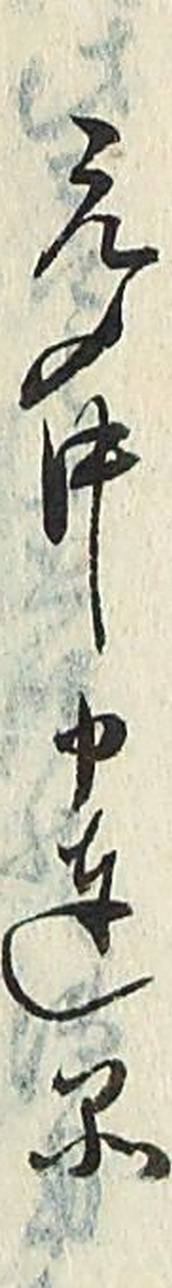元〆中申達品
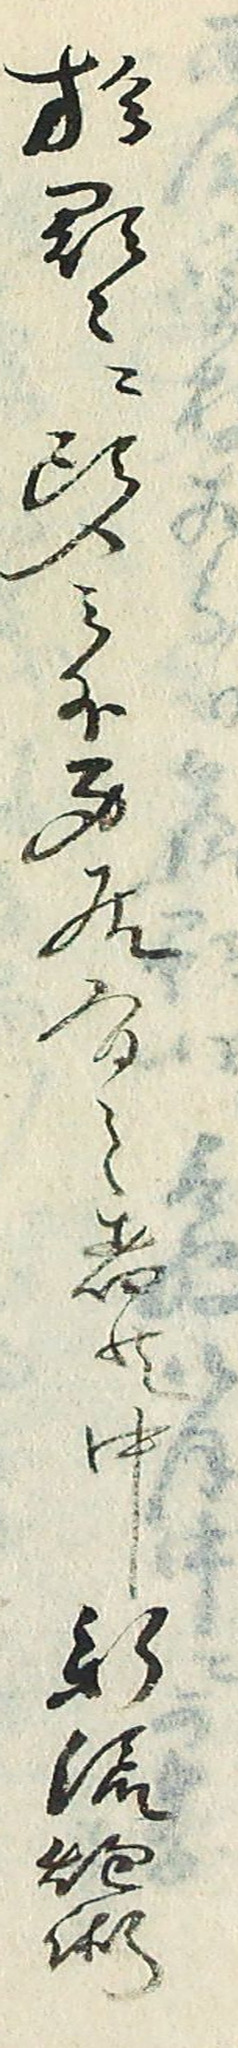於郡々ニ頭入之外身居有之者共中新流砲術
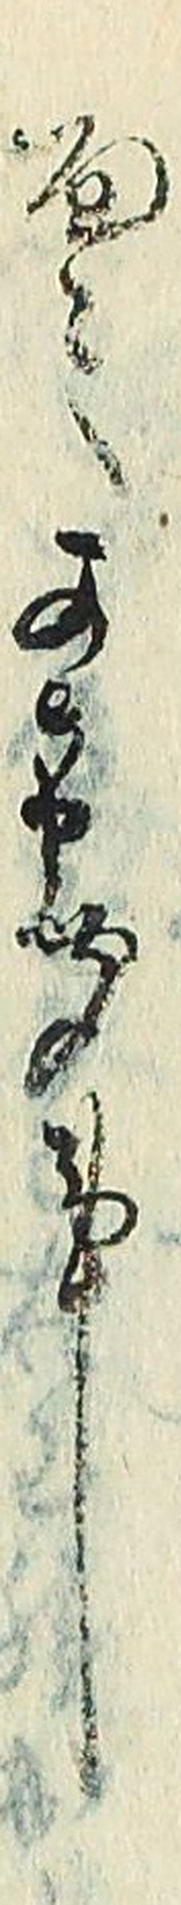面々へ可被申聞事
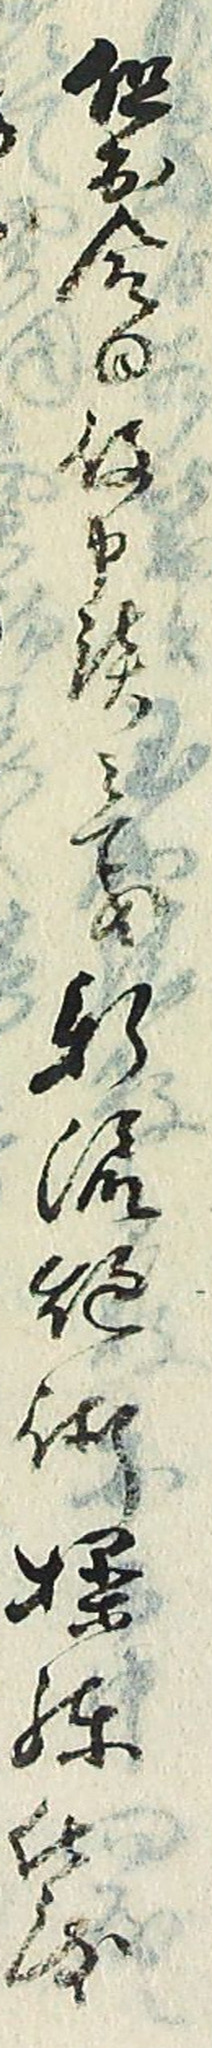但出合同役申談之義新流砲術操練仕度
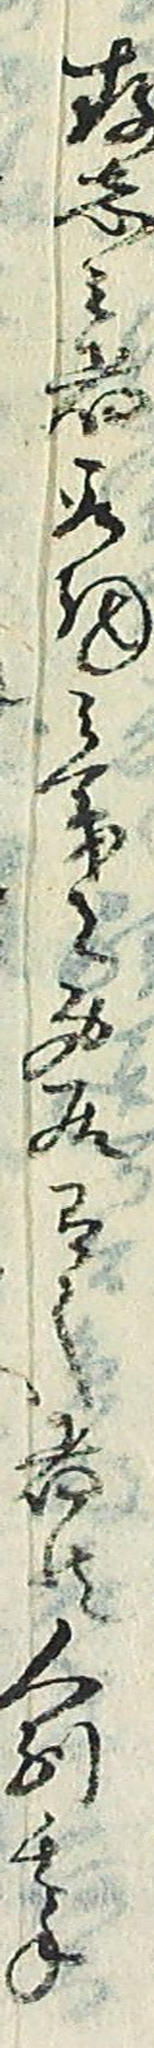存念之者取調之義者身居有之者共人別其年
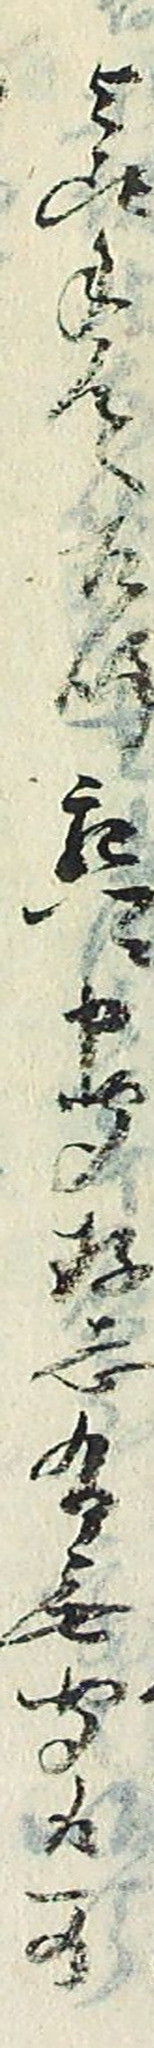与頭手元へ召呼懇ニ申聞存念有無聞取可
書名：諸御趣意書并御下知向之写
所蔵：鳴門教育大学 Naruto University of Education
